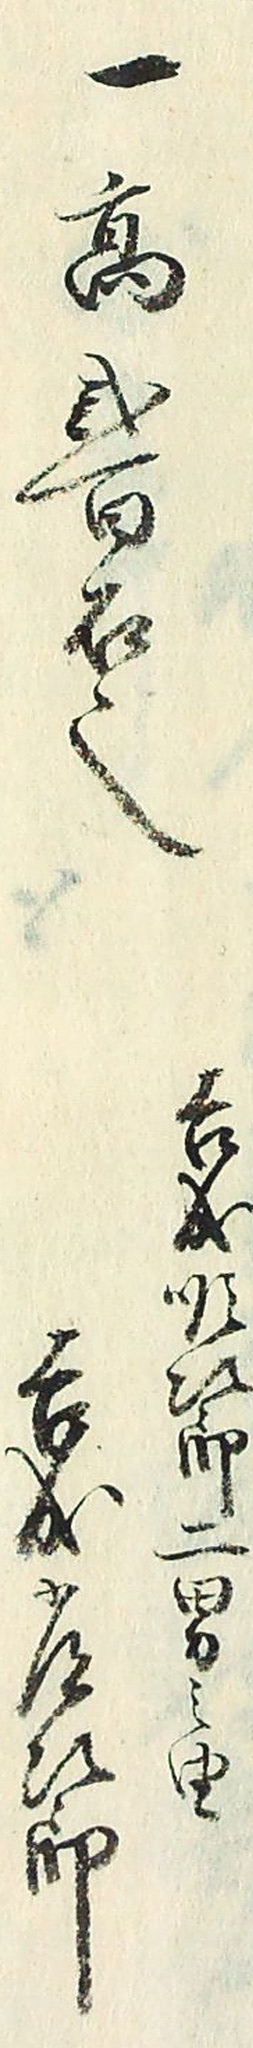一高弐百石也吉成常次郎
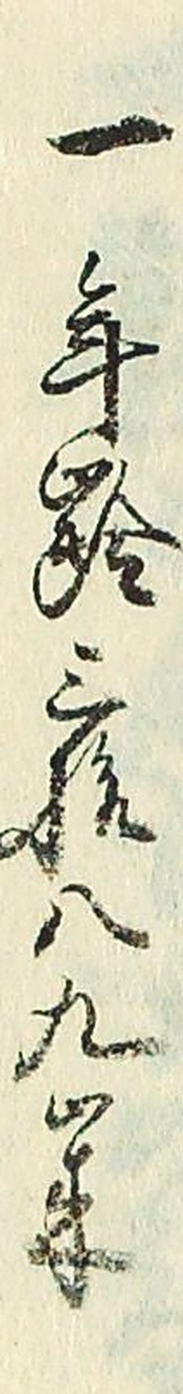一年齢三拾八九歳
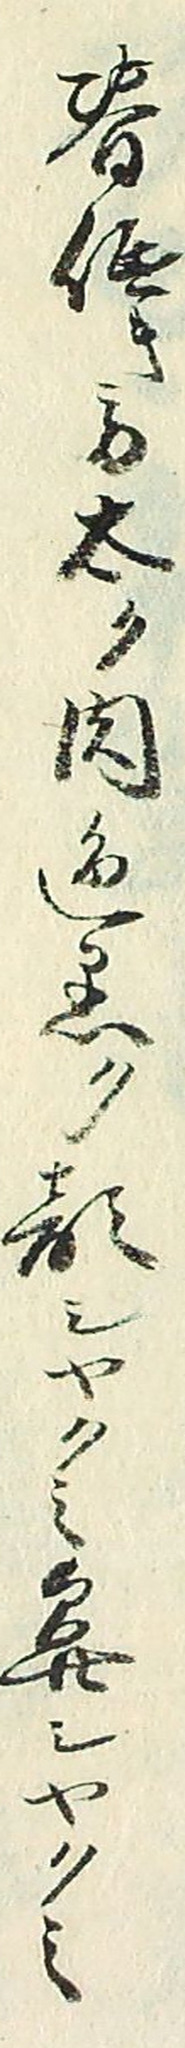脊低キ方太ク肉色黒ク顔シヤクミ鼻シヤクミ
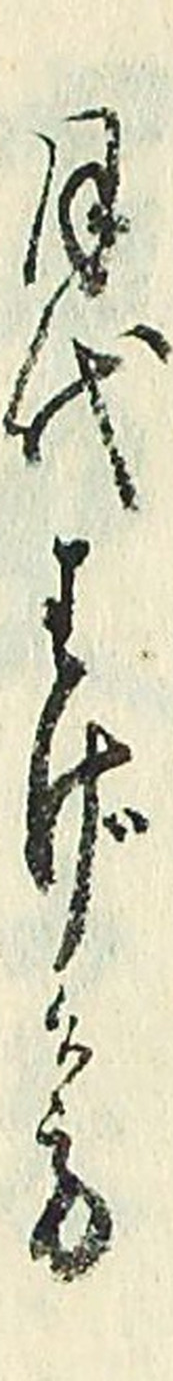月代はげ候方
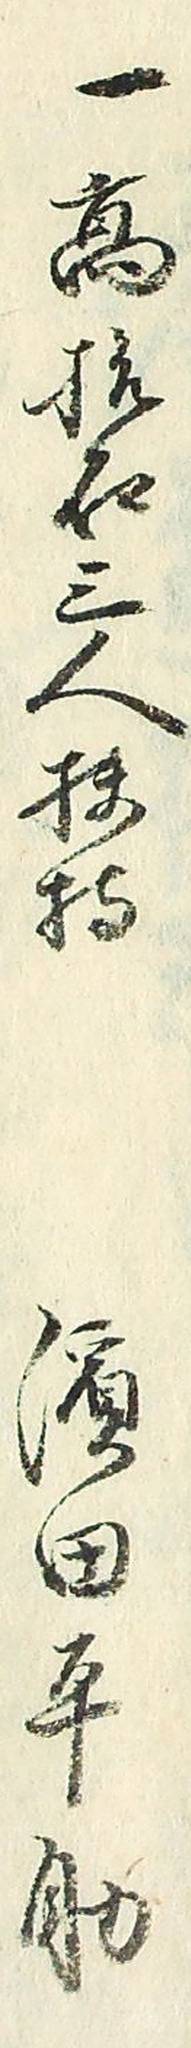一高拾石三人扶持濱田平助
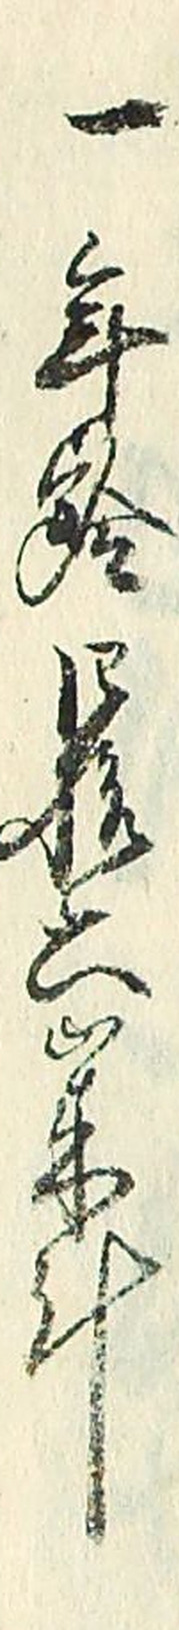一年齢四拾六歳計
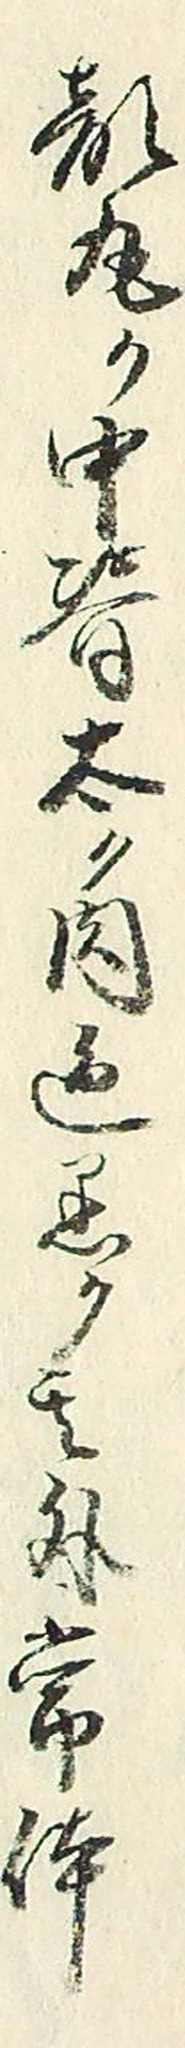顔丸ク中脊太ク肉色黒ク其外常体

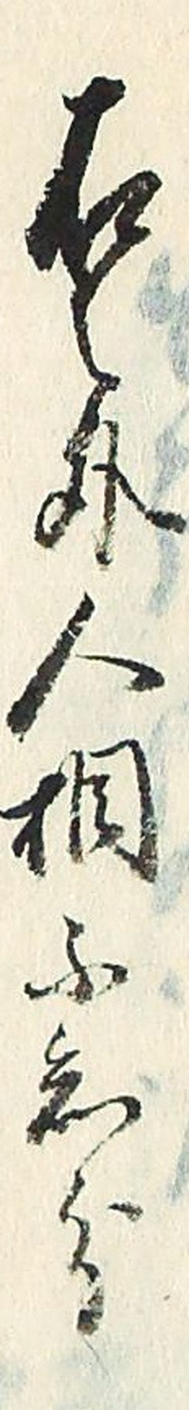右之外人相不知分
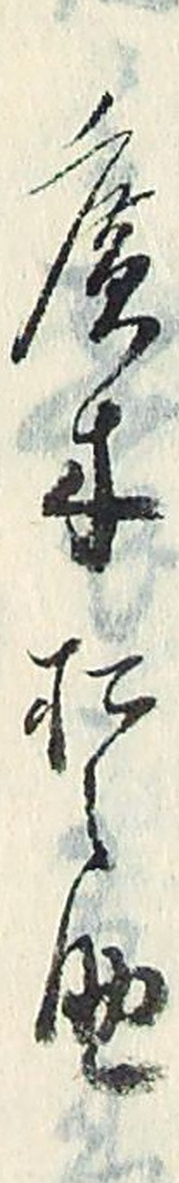廣木松之助
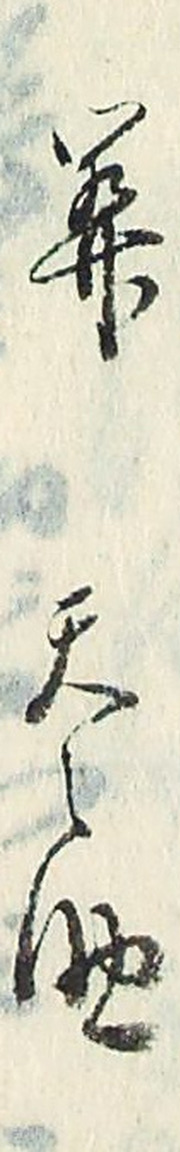関天之助
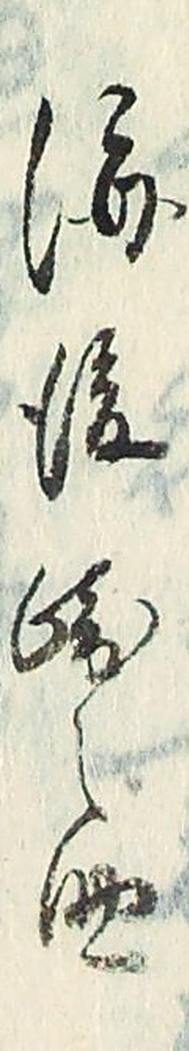海後崎之助
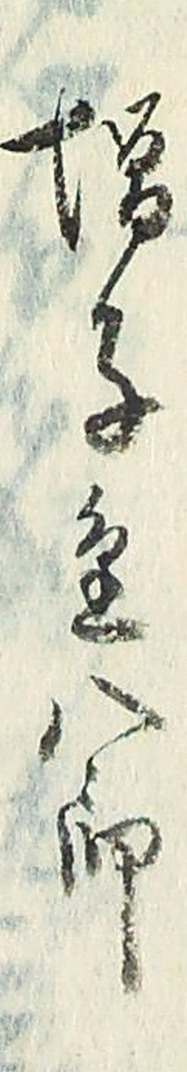増子金八郎
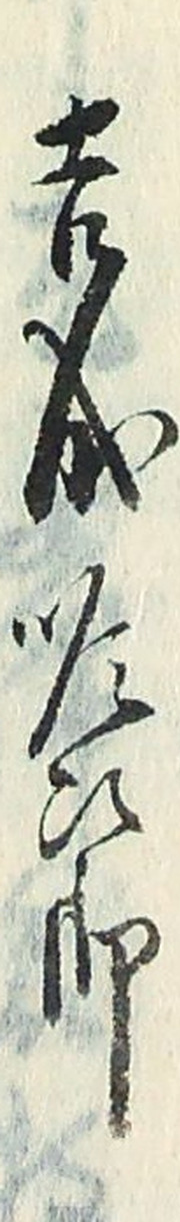吉成順次郎

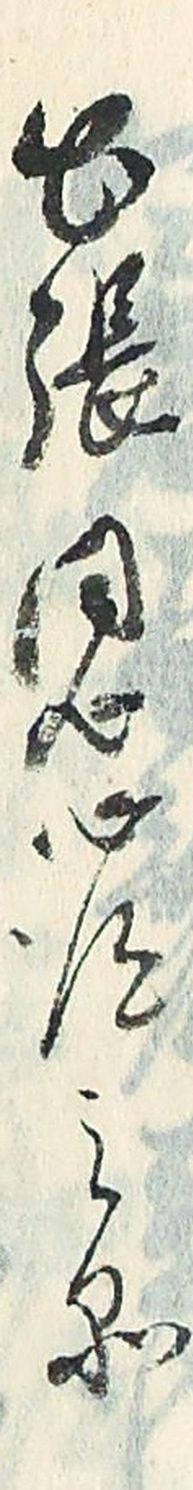出張同心心得之品
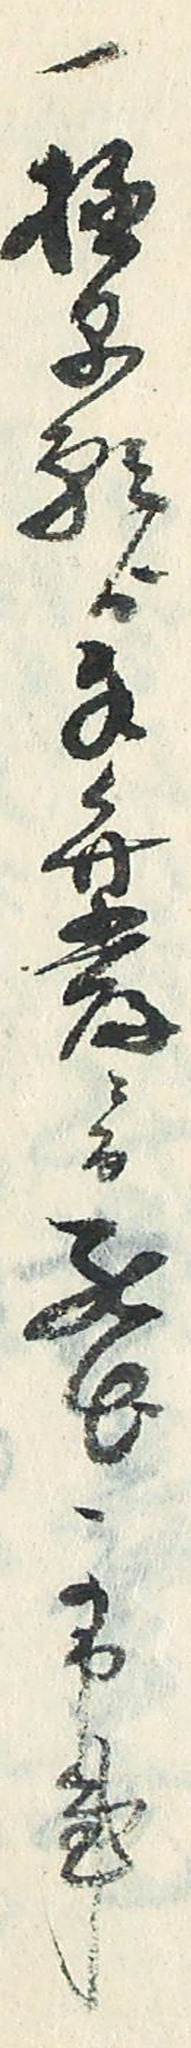一極早朝ゟ手弁當ニ而罷出可申事
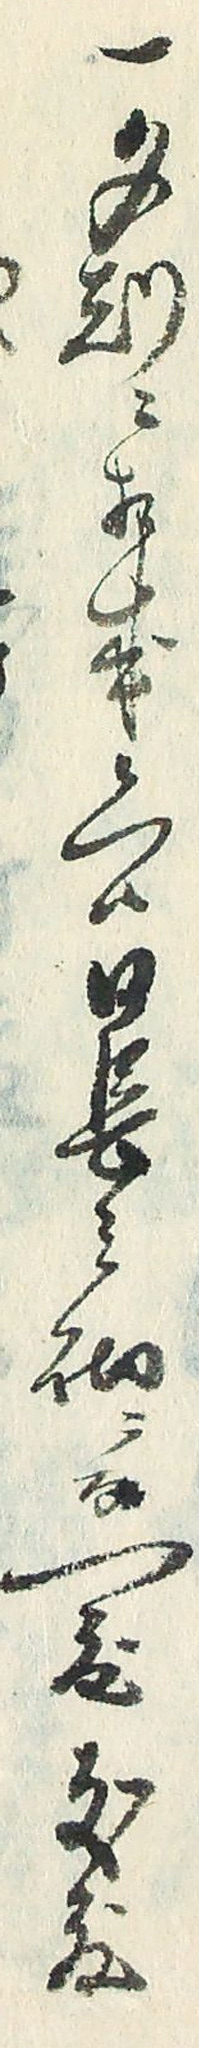一夕刻ニ相成候へハ日長之砌ニ而一度仕度
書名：諸御趣意書并御下知向之写
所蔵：鳴門教育大学 Naruto University of Education
